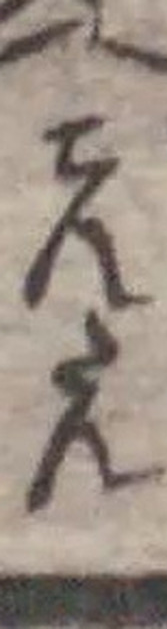こんたん
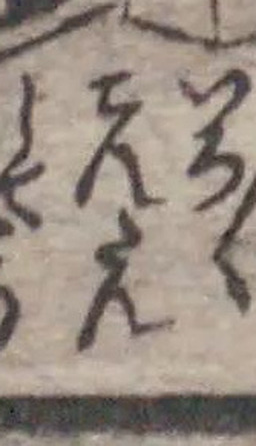こんたん
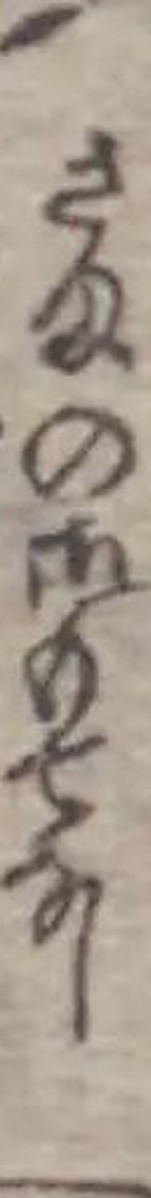さまのおもてなし
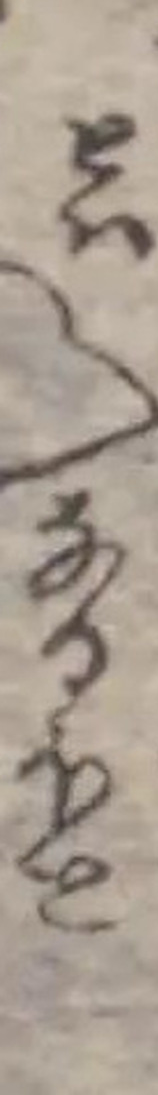とはなるほと
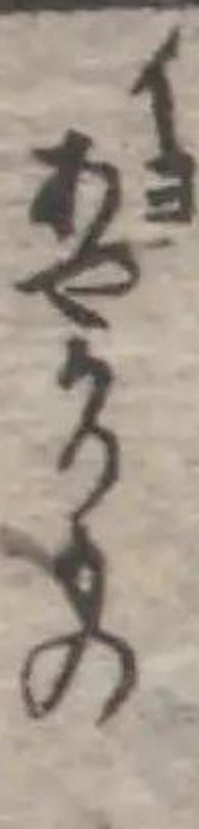あやかりもの

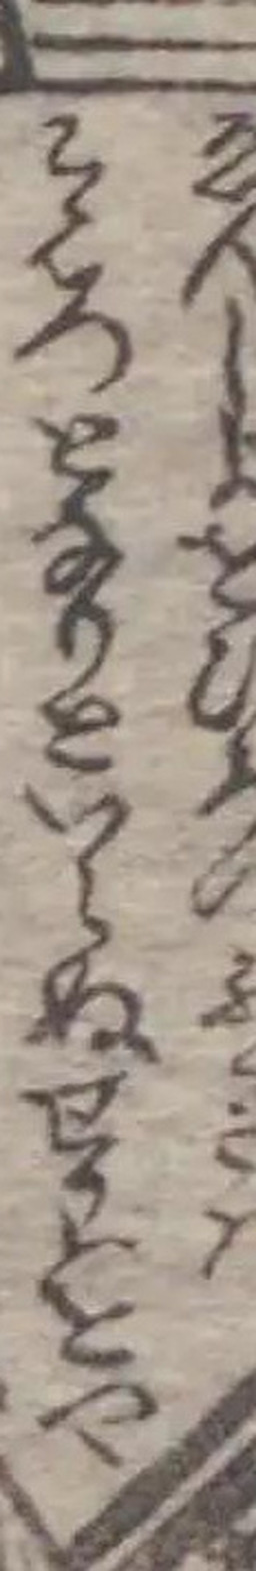こはつとなりといらぬせわをやく
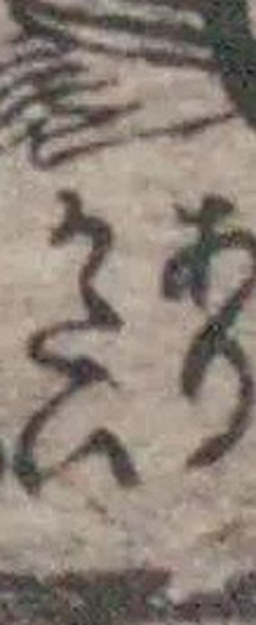かたい
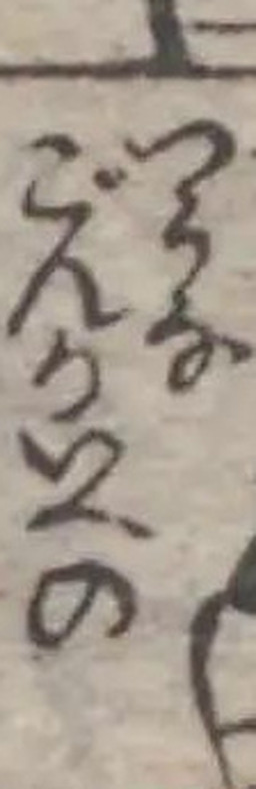ごんかいへの
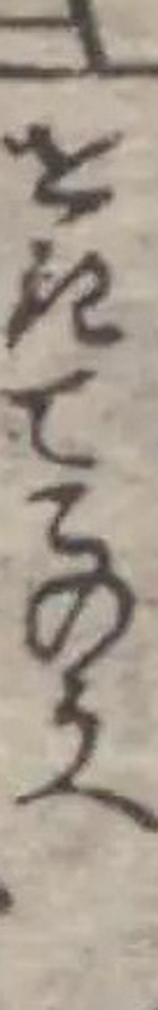をきてこのうへ
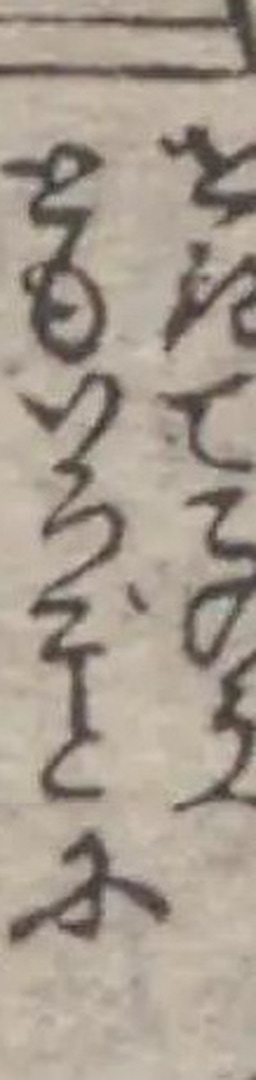ともいろごとに
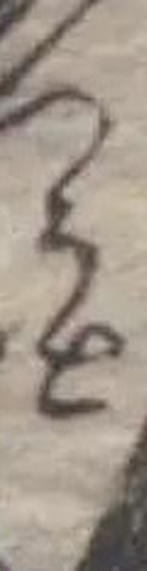つうと
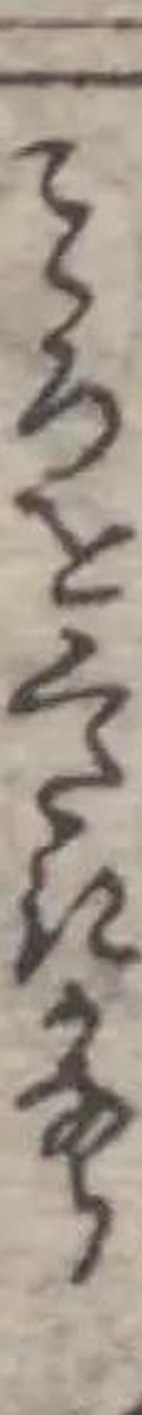こゝろをくだきかなら
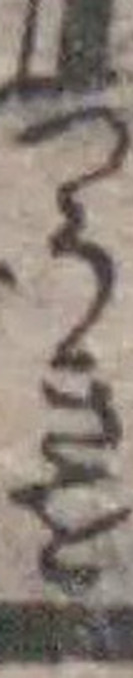つうきを
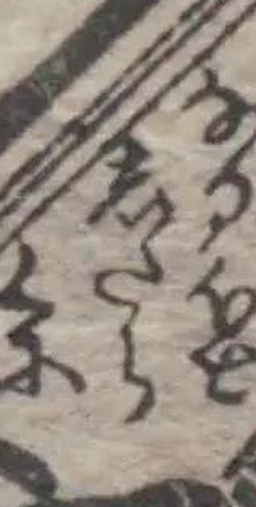したら
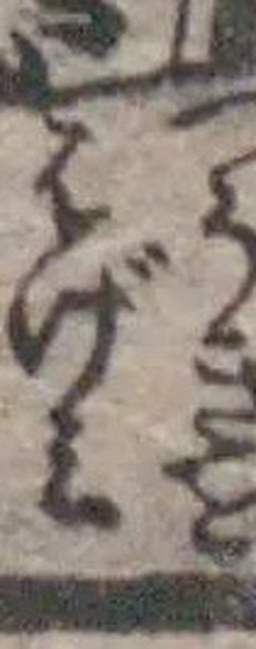はげみ
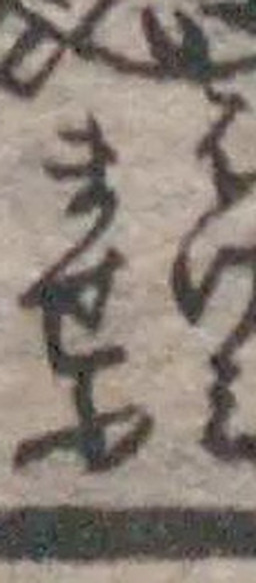ませふ
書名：富多高慢噺 3巻
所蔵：国立国会図書館 National Diet Library, JAPAN
